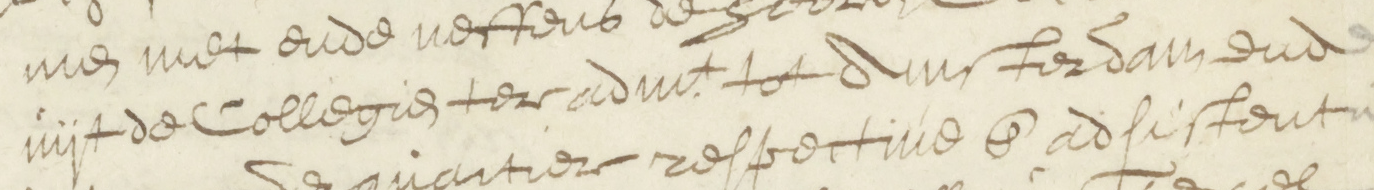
uijt de Collegien ter admt tot Amsterdam ende
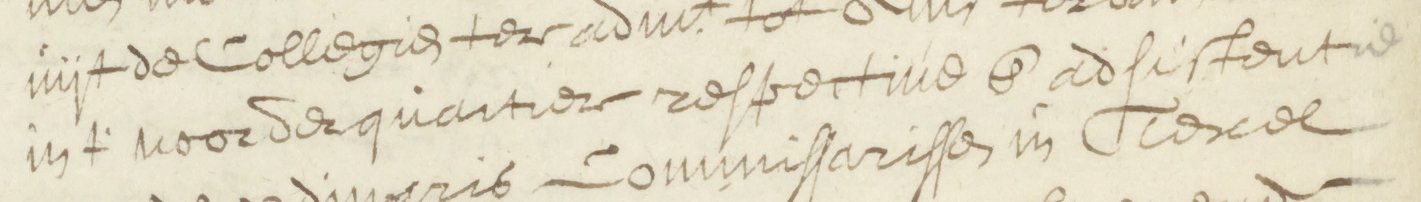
in t' noorderquartier respectiue & adsistentie
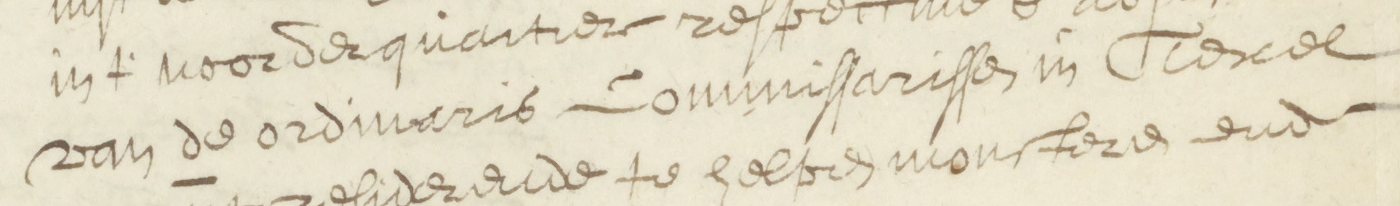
van de ordinaris Commissarissen in Texel
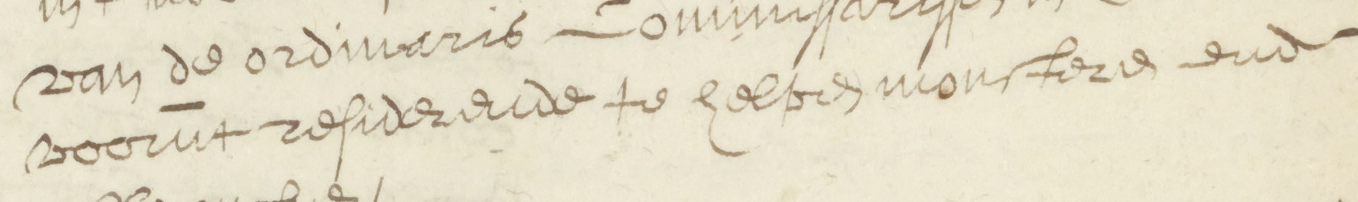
voornt residerende te helpen monsteren ende
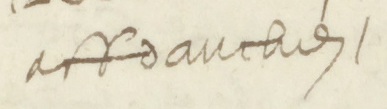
affdancken.
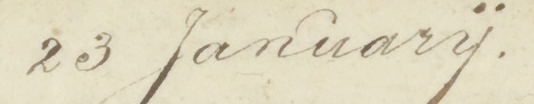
23 Januarij
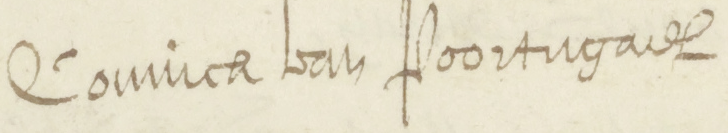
Coninck van Poortugael
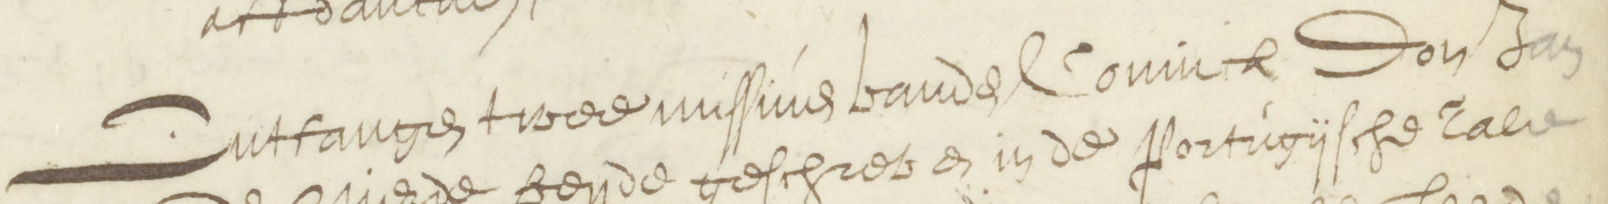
Ontfangen twee missiuen Vanden Coninck Don Jan
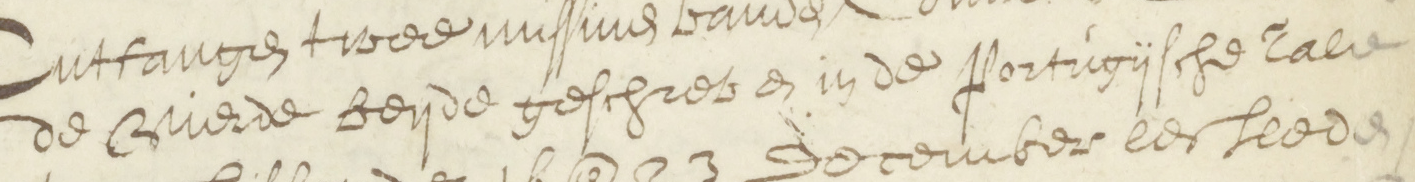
de Vierde beyde geschreven in de Portugijsche Tale
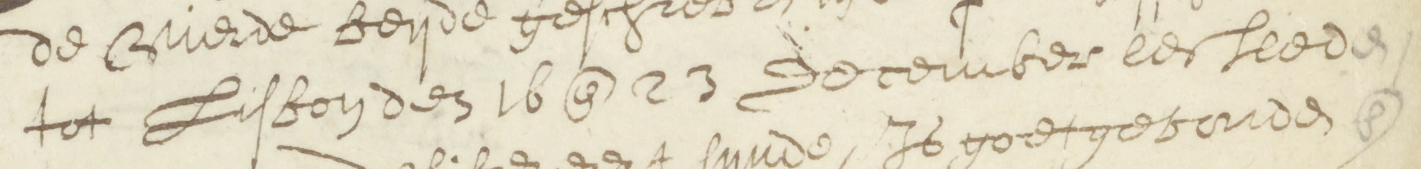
tot Lisbon den 16 & 23 December lestleden.
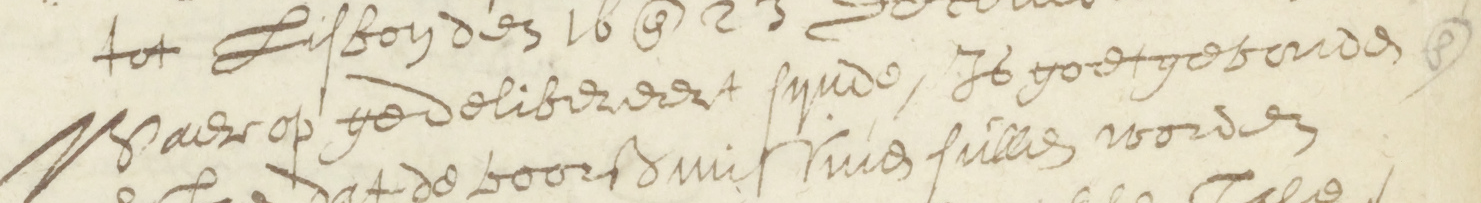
Waerop gedelibereert synde, Is goetgevonden &
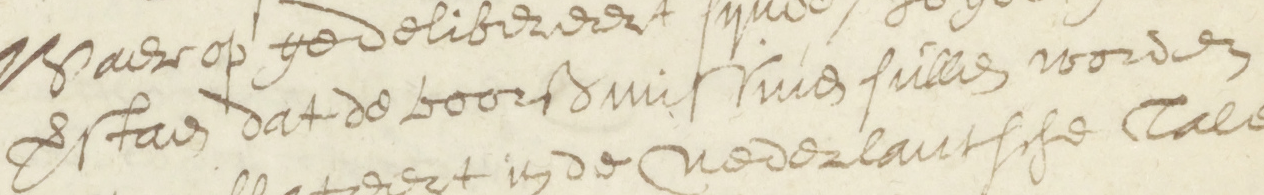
vstaen dat de voorsz missiuen sullen worden
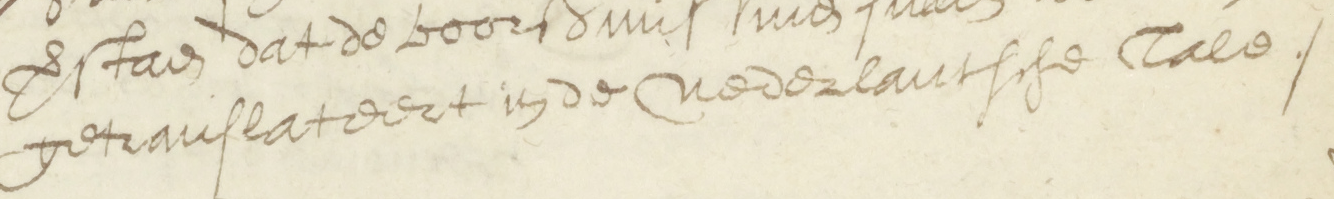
getranslateert in de Nederlandsche Tale.
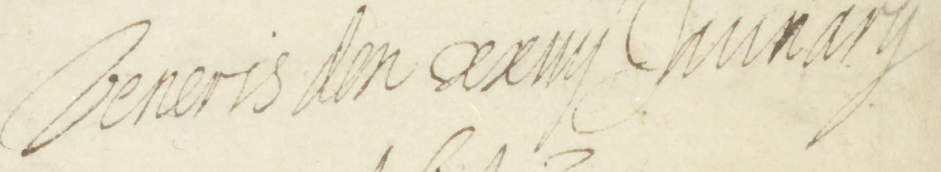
Veneris den xxiiij January
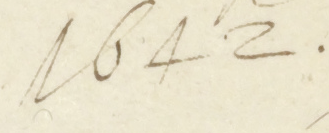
1642
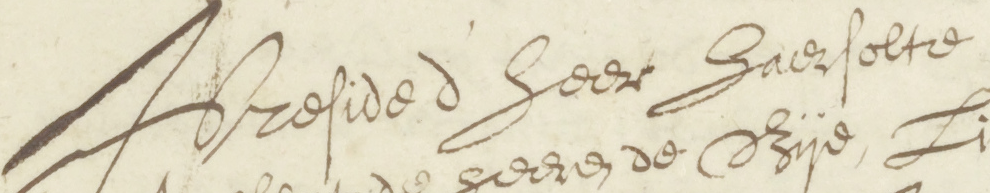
Preside d'heer haersolte
